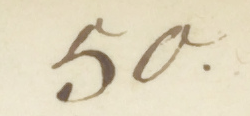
50.
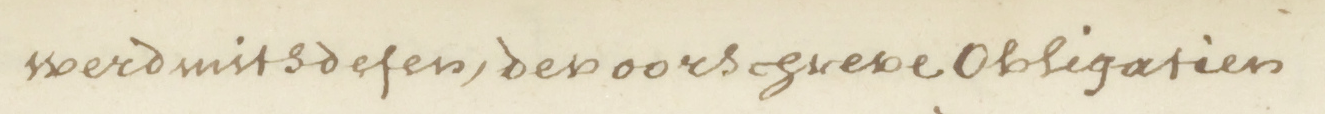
werd mits desen, de voorschreve Obligatien
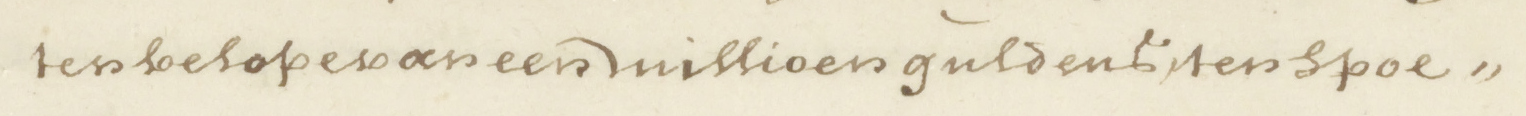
ten belope van een millioen guldens, ten spoe„
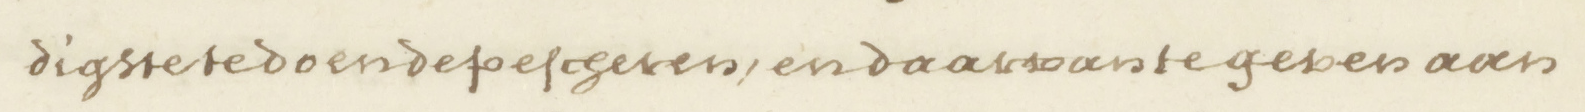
digste te doen depescheren, en daarvan te geven aan
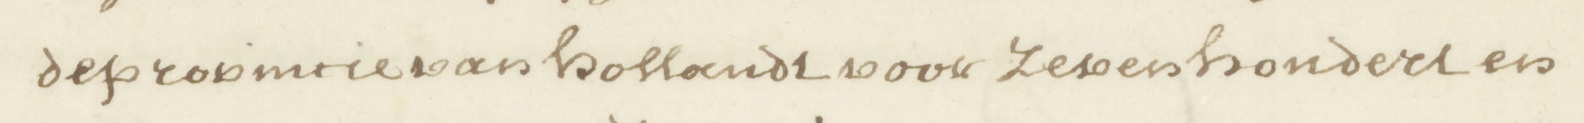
de provincie van Hollandt voor zevenhondert en
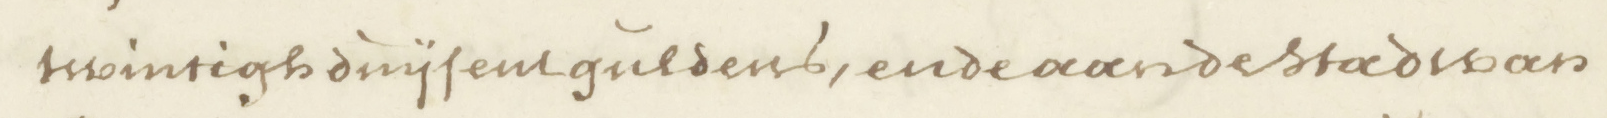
twintighduijsent guldens, ende aan de stad van
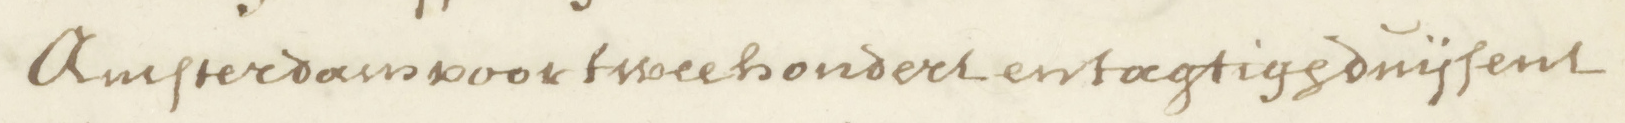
Amsterdam voor tweehondert en tagtighduijsent
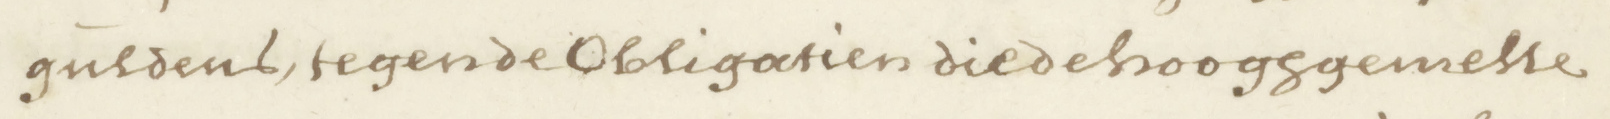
guldens, tegen de Obligatien die de hooghgemelte
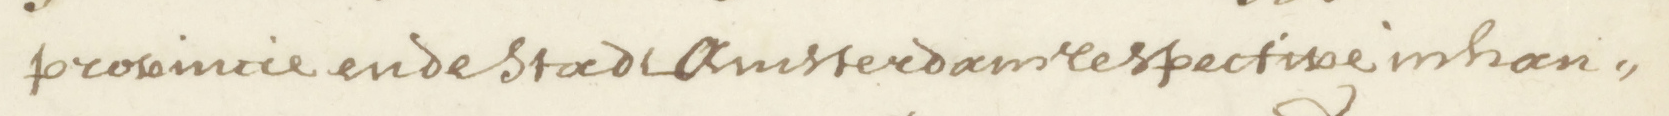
provincie ende stadt Amsterdam respective in han„
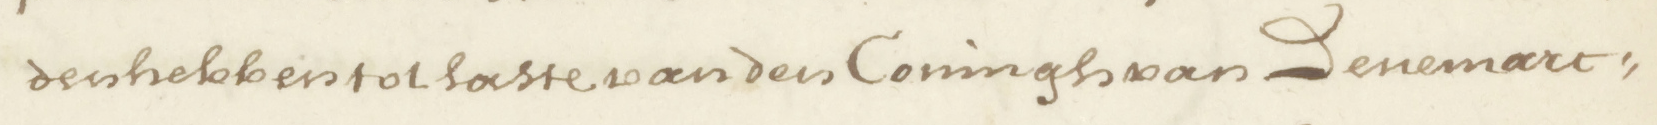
den hebbben tot laste van den Coningh van Denemarc„
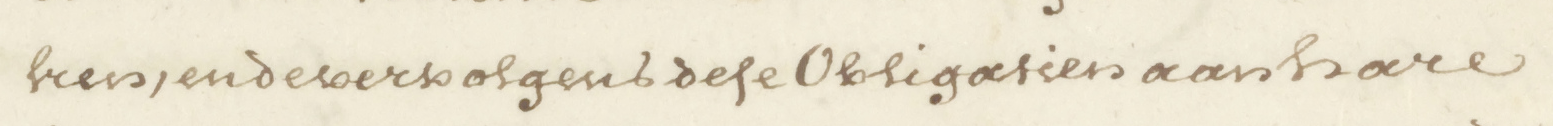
ken, ende vervolgens dese Obligatien aan hare
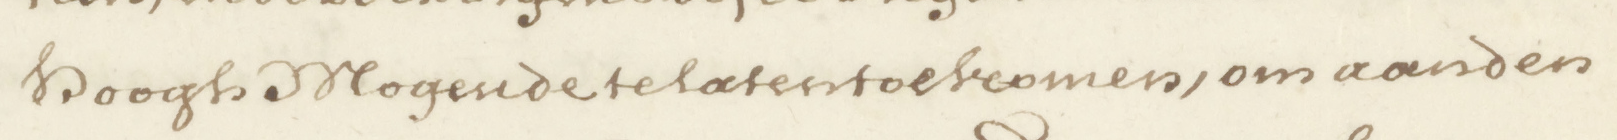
Hoogh Mogende te laten toekomen, om aanden
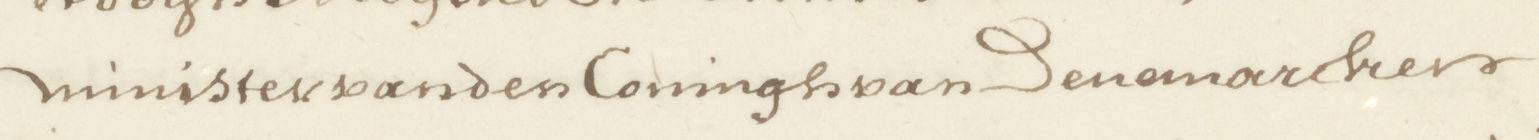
minister vanden Coningh van Denemarcken
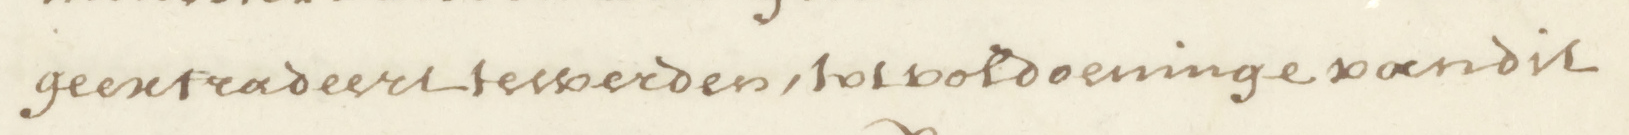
geextradeert te werden, tot voldoeninge van dit
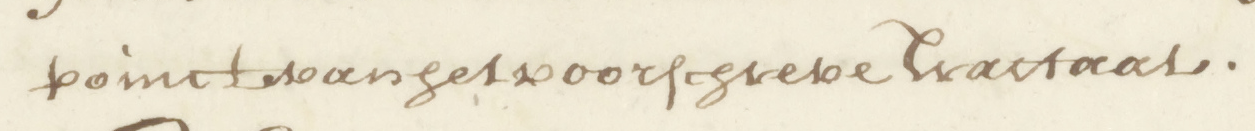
poinct van het voorschreve Tractaat.
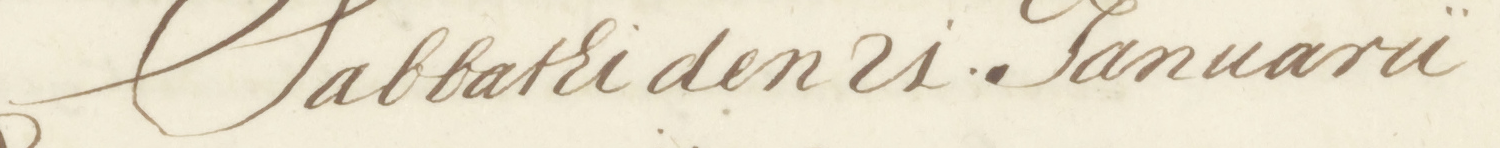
Sabbathi den 21. Januarii
